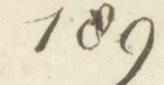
189.
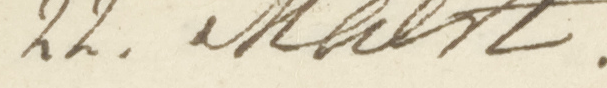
22. Maert.
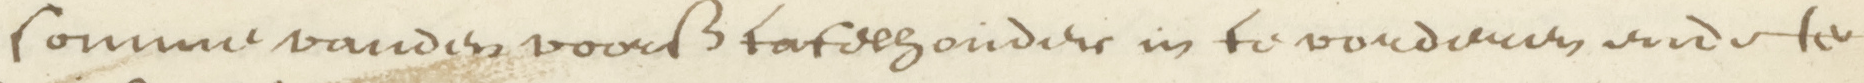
somme vanden voors tafelhouder in te vorderen ende te
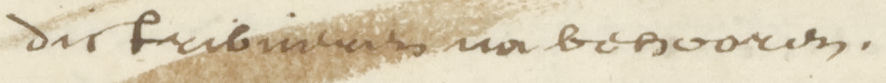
distribueren na behooren.
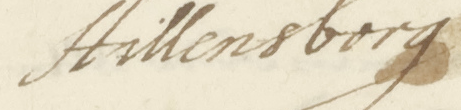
Hillensberg
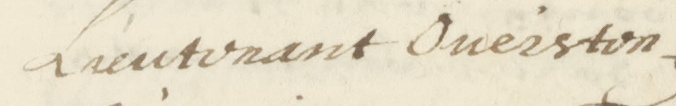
Lieutenant Ouersten,
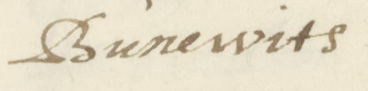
Bunewits
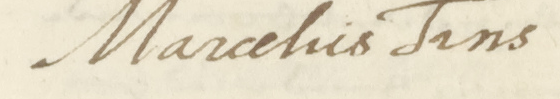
Marcelus Tins
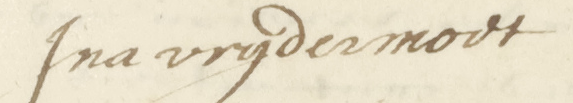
Ina vrydermoet
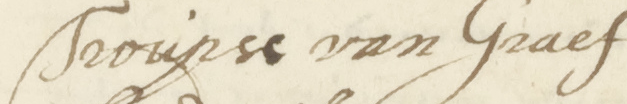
Troupss van Graef
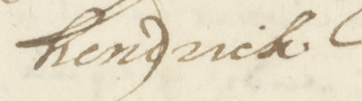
hendrick
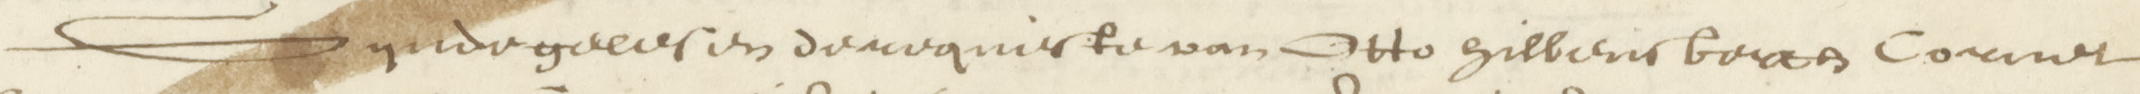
Synde gelesen de requeste van Otto hillensberch Cornet
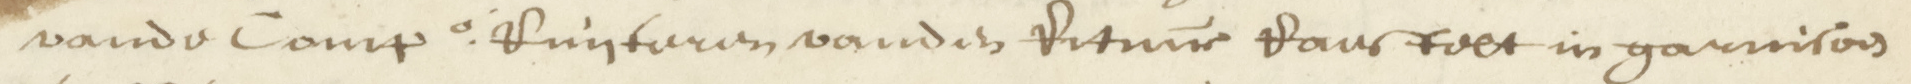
vande Compe. Ruyteren vanden Ritmr Raesfelt in garnisoen
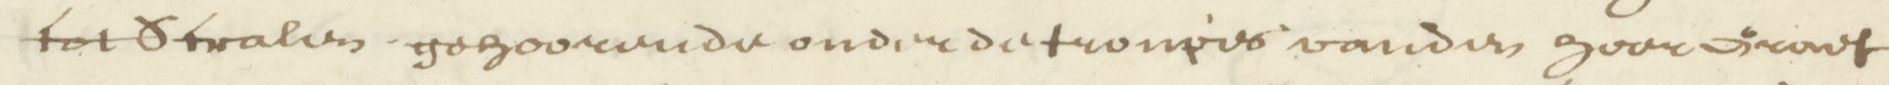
tot Stralen gehoorende onder de troupes vanden heer Graef
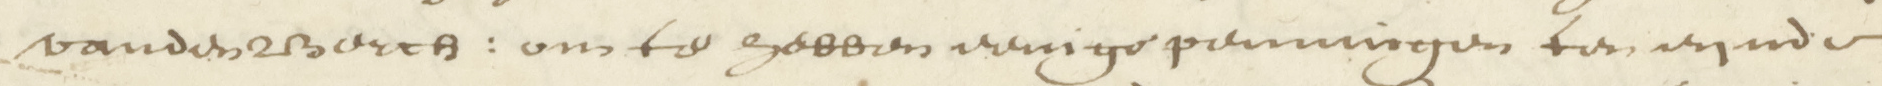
vanden Berch: om te hebben eenige penningen ten eynde
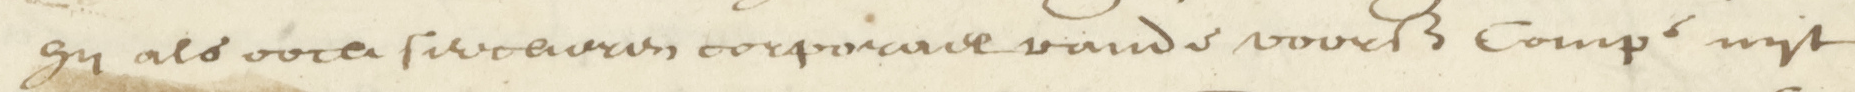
hy als oock seeckeren corporael vande voors Compe uyt
